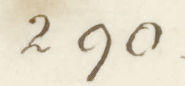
290.
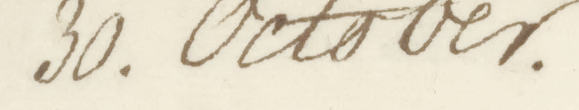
30. October.
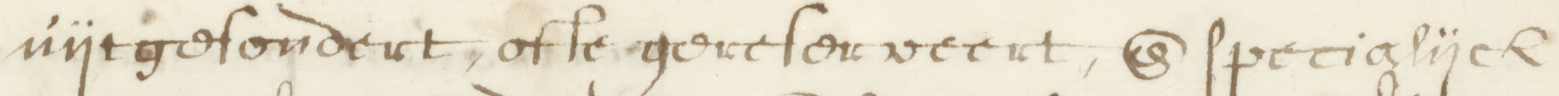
uijtgesondert, ofte gereserveert, & specialijck
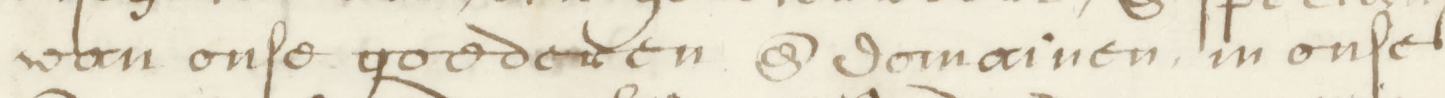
van onse goederen & domainen, in onse
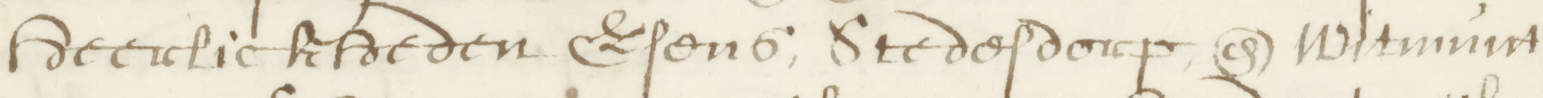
Heerlickheden Esens, Stedesdorp, & Witmunt,
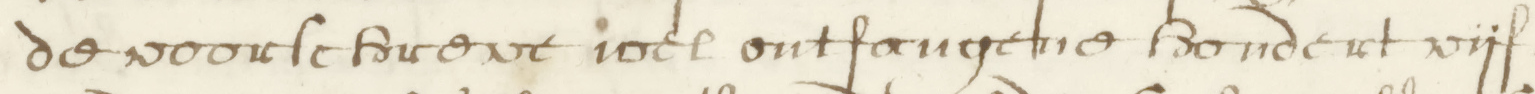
de voorschreve wel ontfangene hondert vijf„
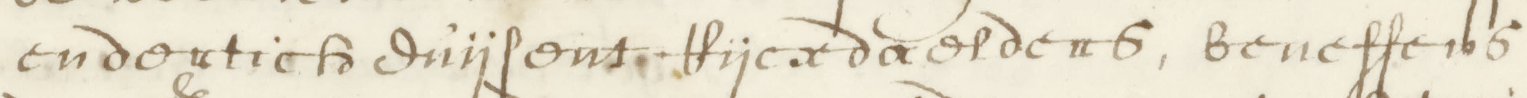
endertich Duijsent Rijcxdaelders, beneffens
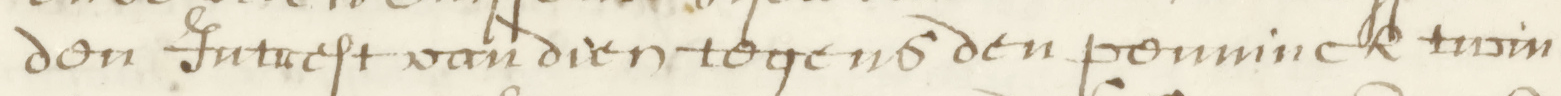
den Intrest van dien tegens den penninck twin„
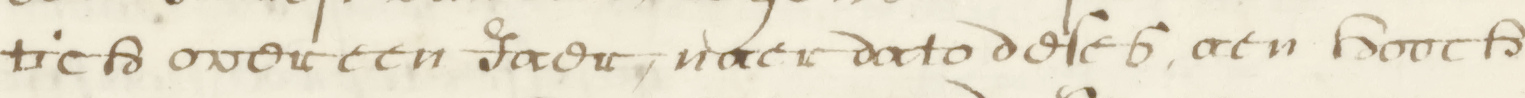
tich over een Jaer, naer dato deses, aen hooch
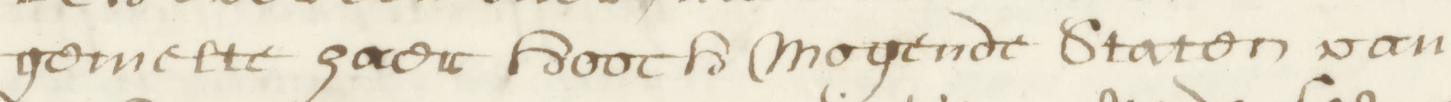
gemelte haer Hooch Mogende Staten van
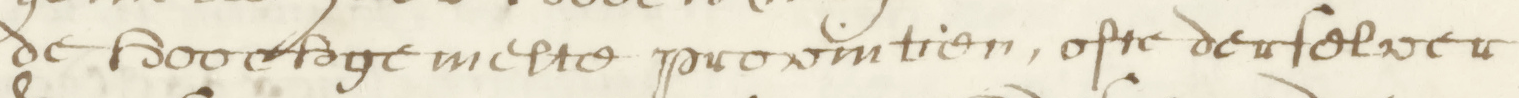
de hoochgemelte provintien, ofte derselver
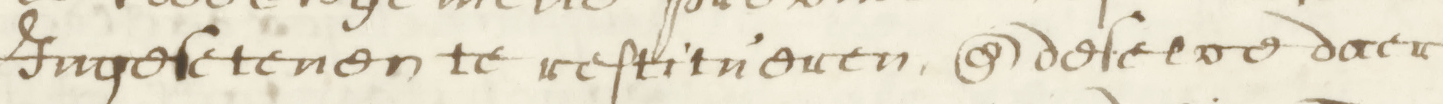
Ingesetenen te restitueren, & deselve daer
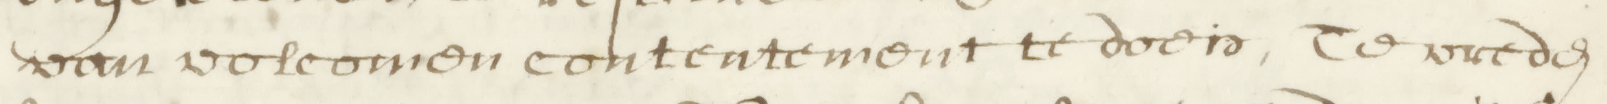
van volcomen contentement te doen. Tevreden
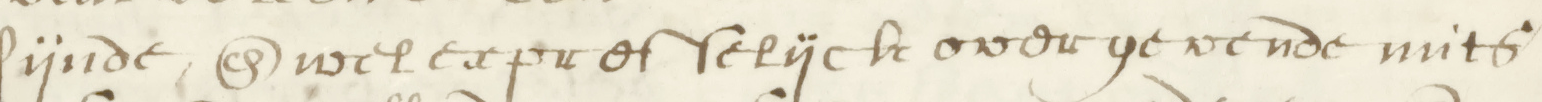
sijnde, & wel expresselijck overgevende mits
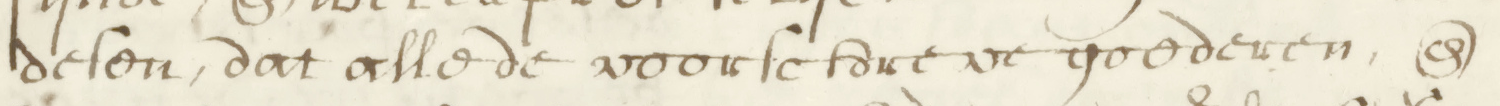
desen, dat alle de voorschreve goederen, &
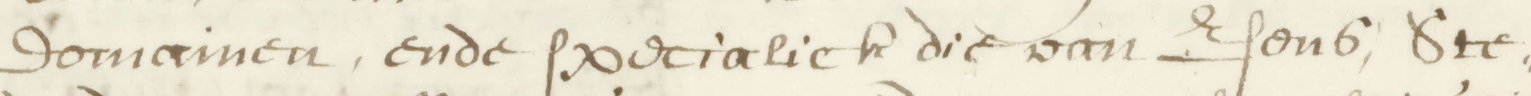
Domainen, ende specialick die van Esens, Ste„
